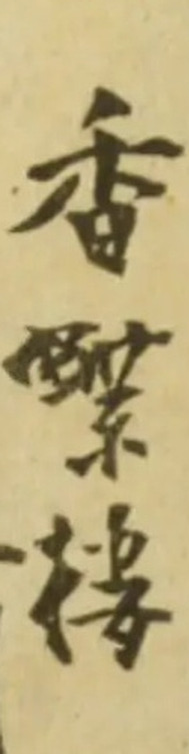香蝶楼
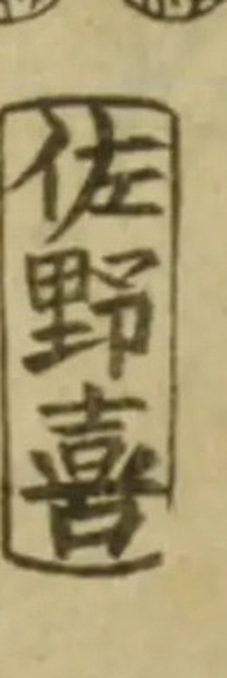佐野喜
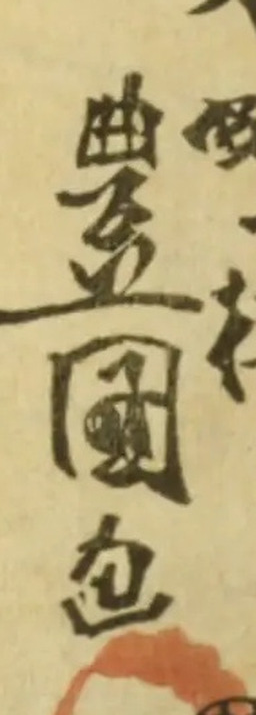豊国画
